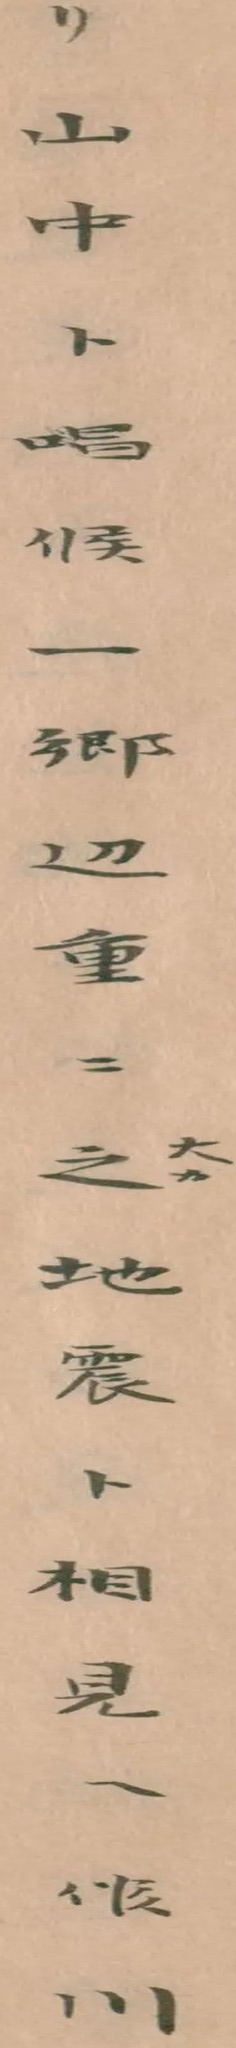り山中ト唱候一郷辺重二大地震ト相見へ候川
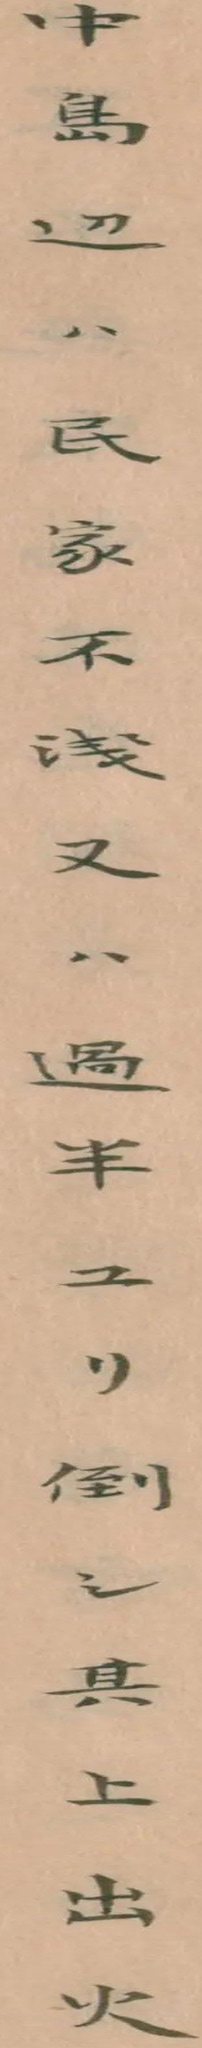中島辺ハ民家不残又ハ過半ユリ倒シ其上出火
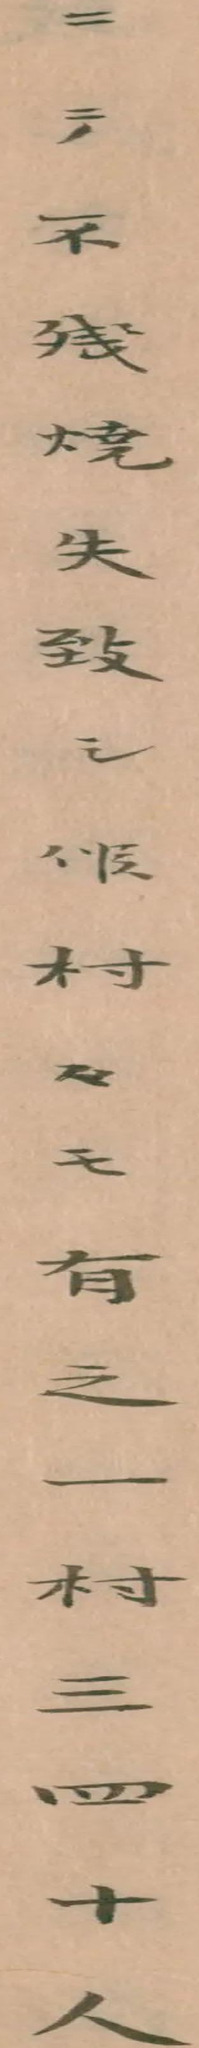二テ不残焼失致シ候村々モ有之一村三四十人
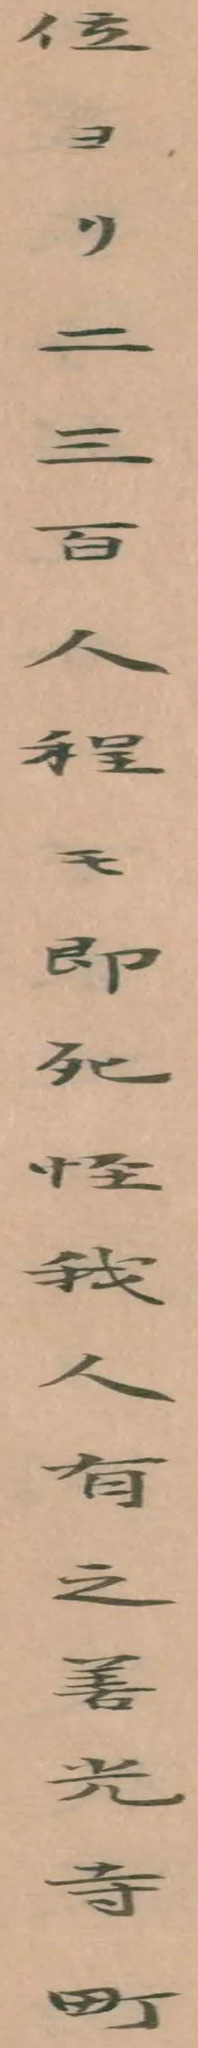位ヨリ二三百人程モ即死怪我人有之善光寺町
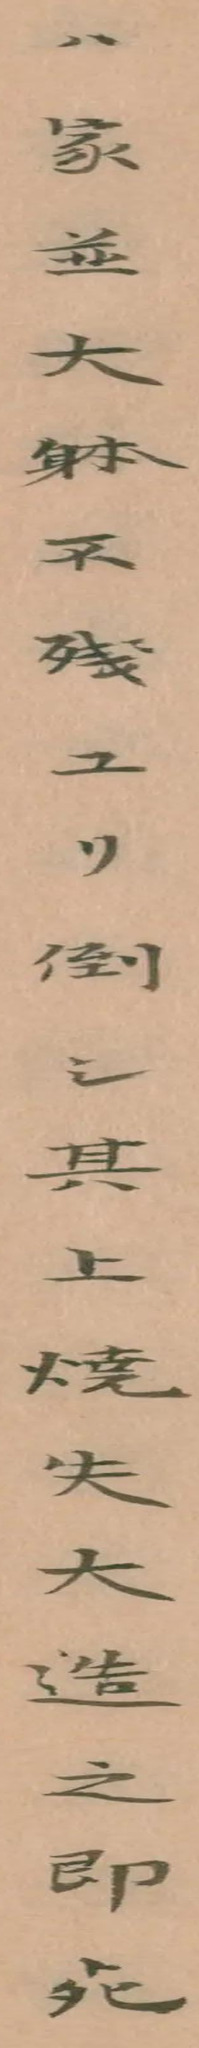ハ家並大体不残ユリ倒シ其上焼失大造之即死
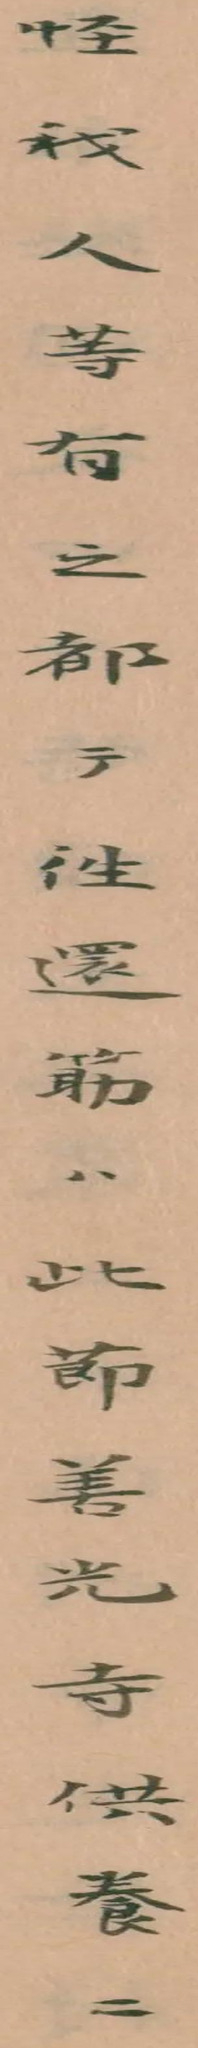怪我人等有之都テ往還筋ハ此節善光寺供養二
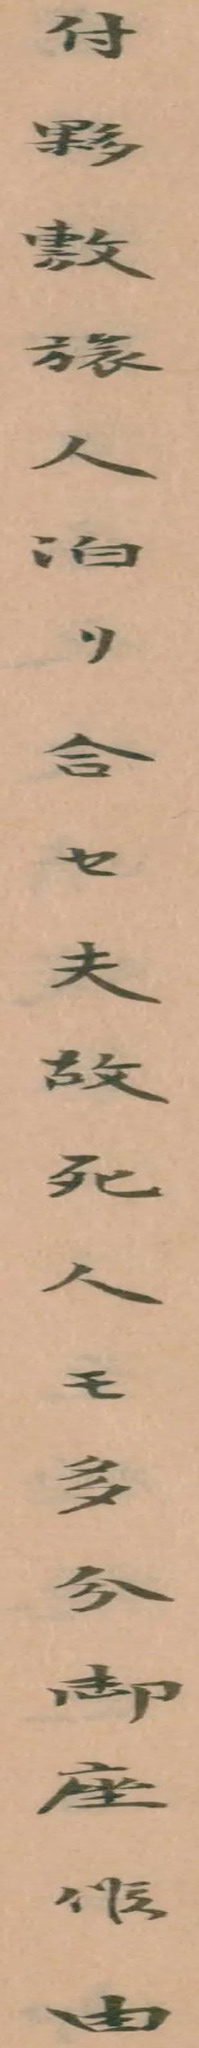付夥敷旅人泊り合せ夫故死人モ多分御座候由
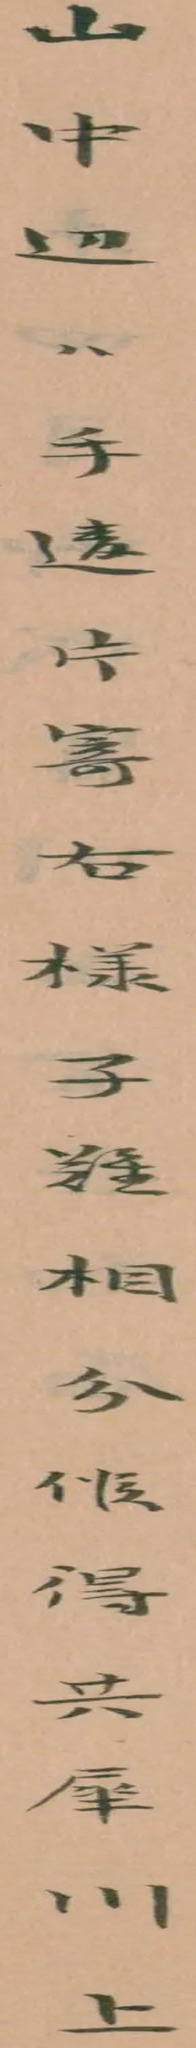山中辺ハ手遠片寄右様子難相分候得共犀川上
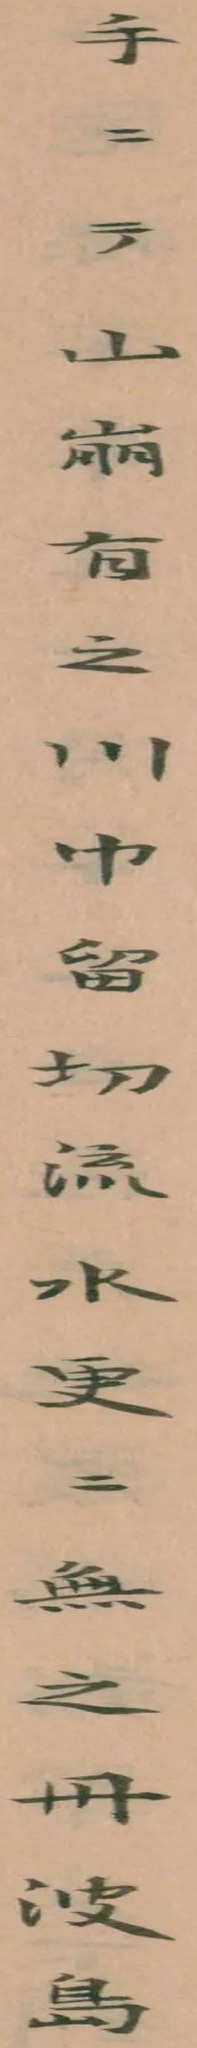手ニテ山崩有之川中留切流水更ニ無之丹波島
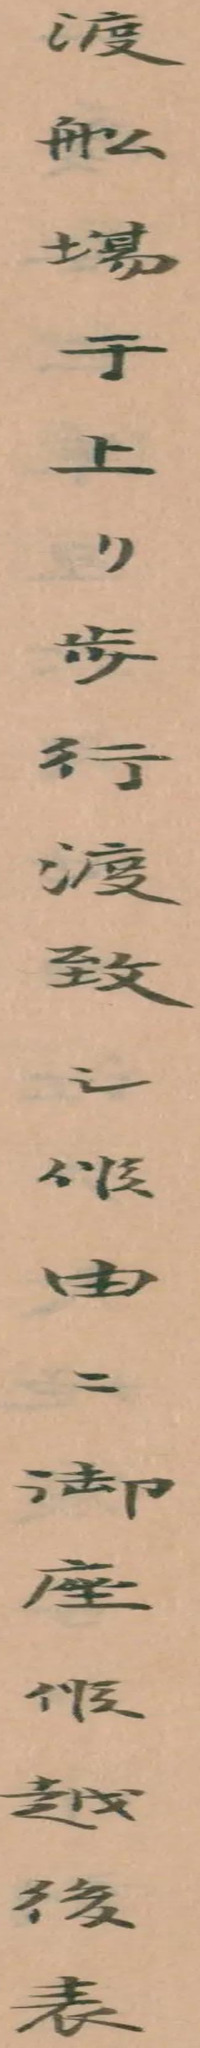渡船場干上り歩行渡致シ候由ニ御座候越後表
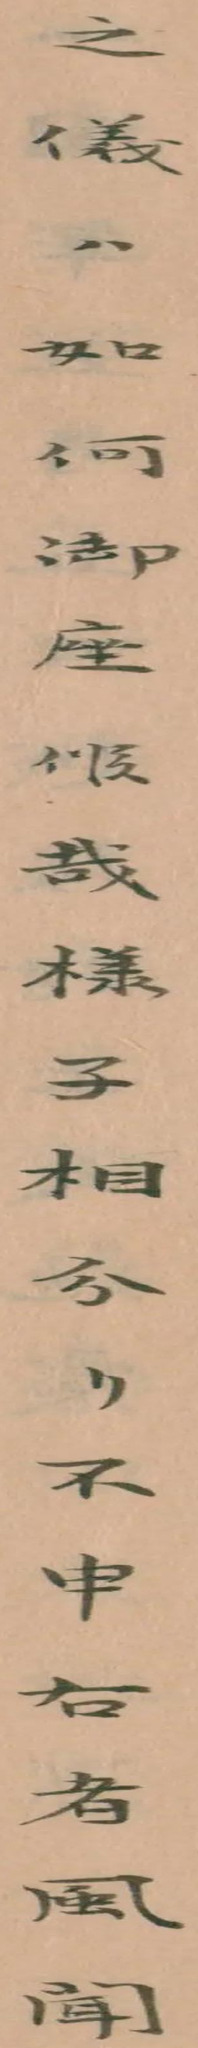之儀者如何御座候哉様子相分リ不申右者風聞
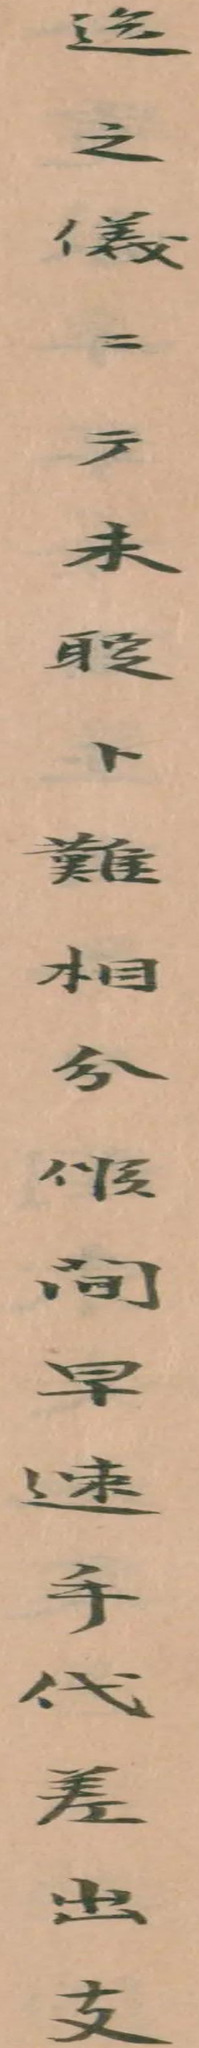迄之儀ニテ未聢ト難相分候間早速手代差出支
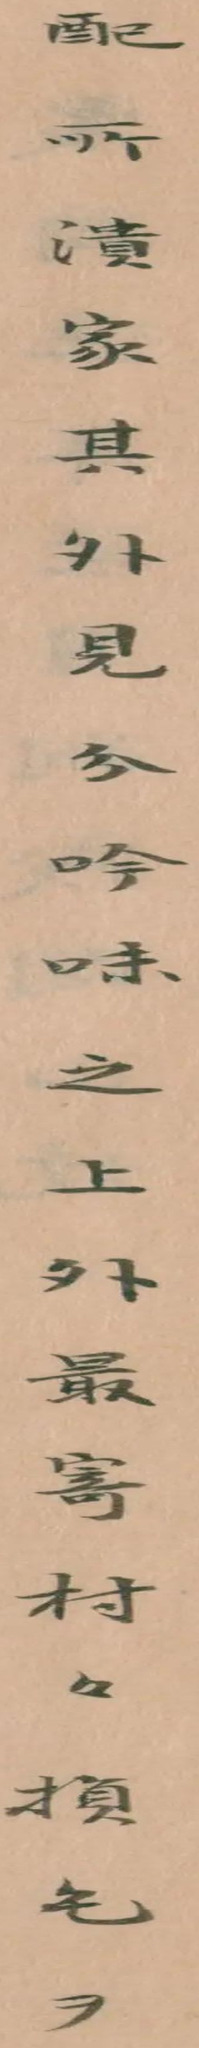配所潰家其外見分吟味之上外最寄村々損毛ヲ
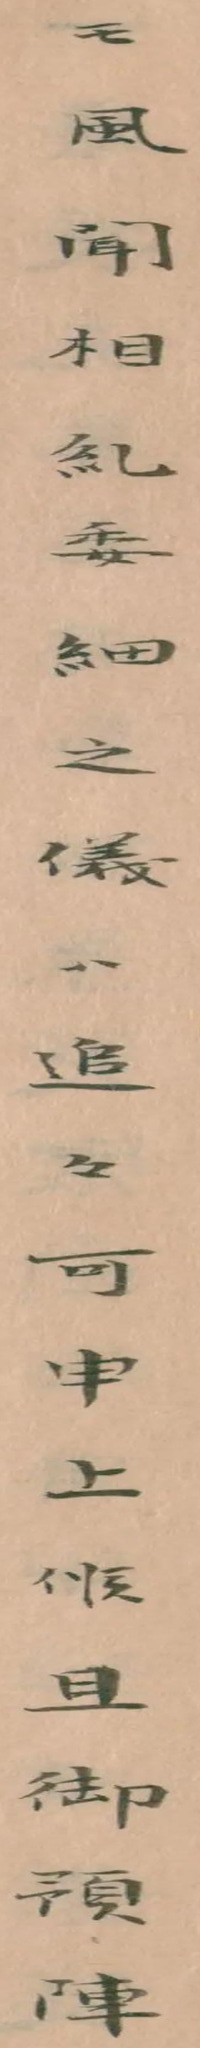モ風聞相糺委細之儀ハ追而可申上候且御預陣
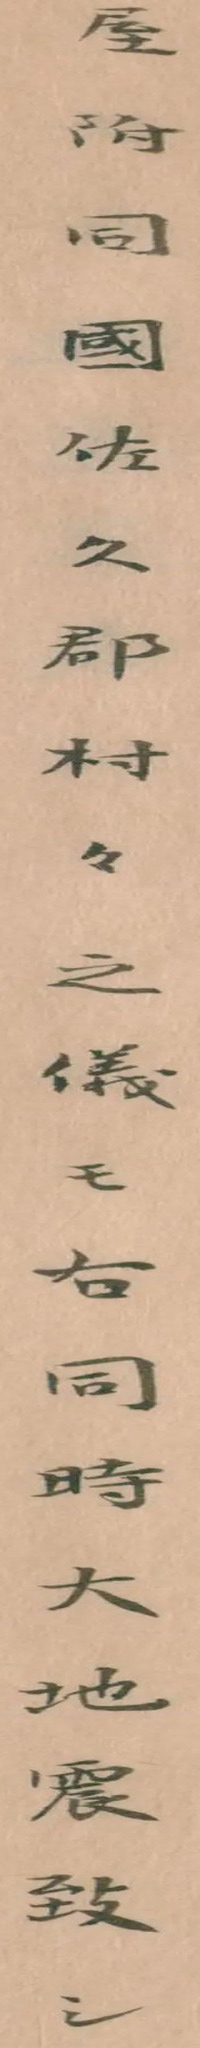屋附同国佐久郡村々之儀モ右同時大地震致シ
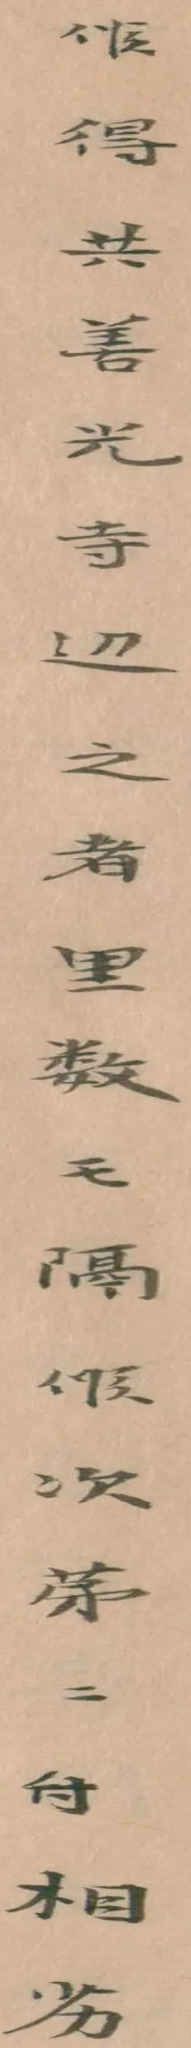候得共善光寺辺と者里数モ隔候次第二付相劣
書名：地災撮要. 巻1(噴火山・地震ノ部)
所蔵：国立国会図書館 National Diet Library, JAPAN
